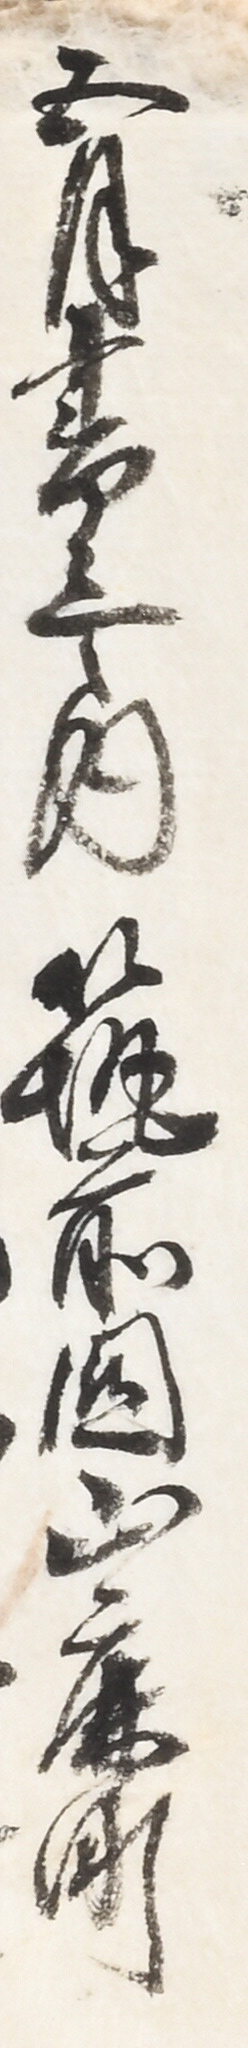五月書上之内筑前国山鹿町
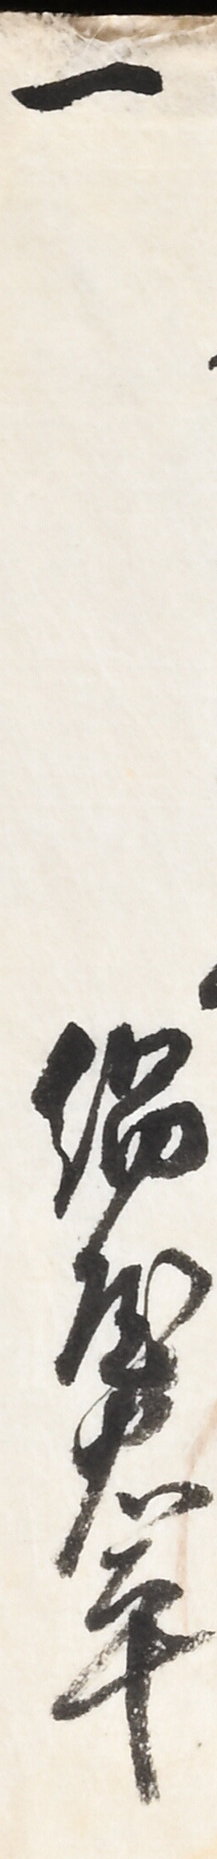一縮屋右平
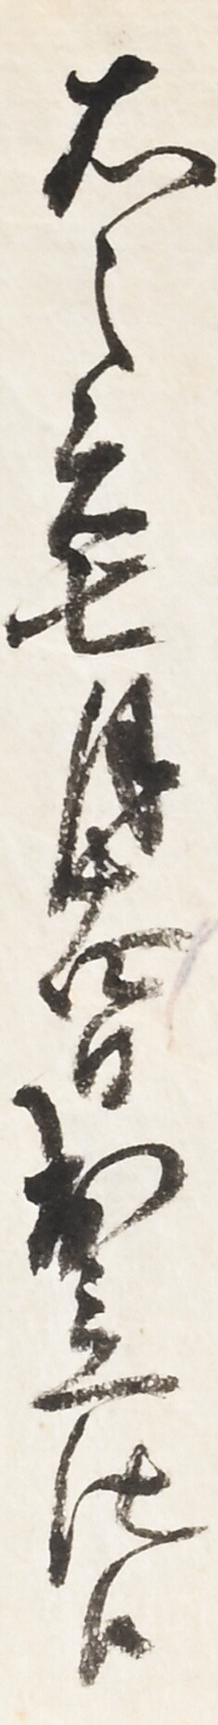右之者七月十四日出立仕候
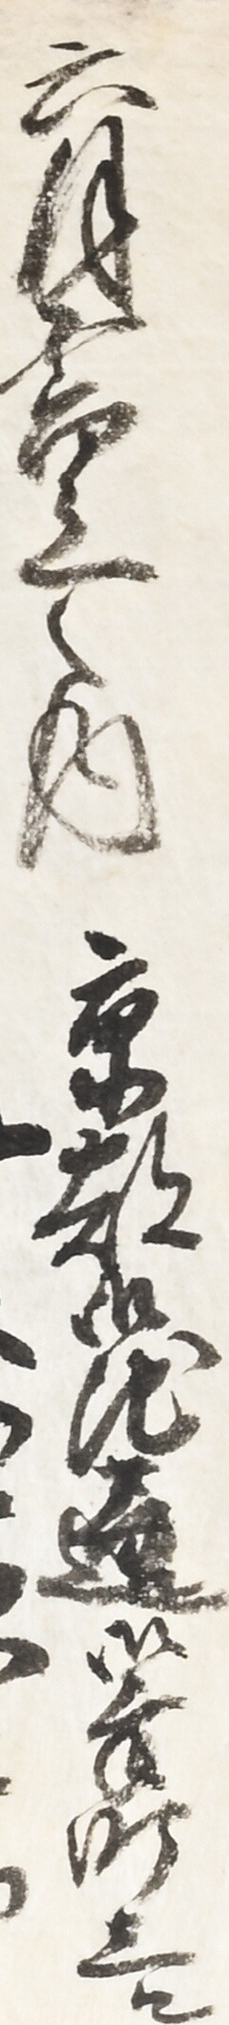六月書上之内京都御池通御幸町上ル
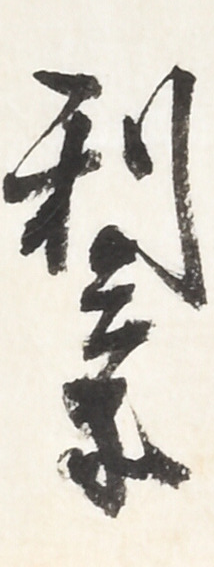利兵衛
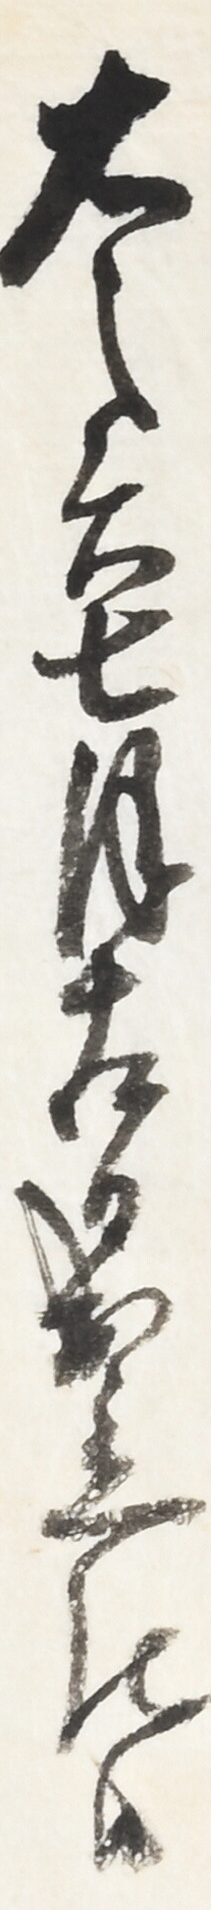右之者七月十四日出立仕候
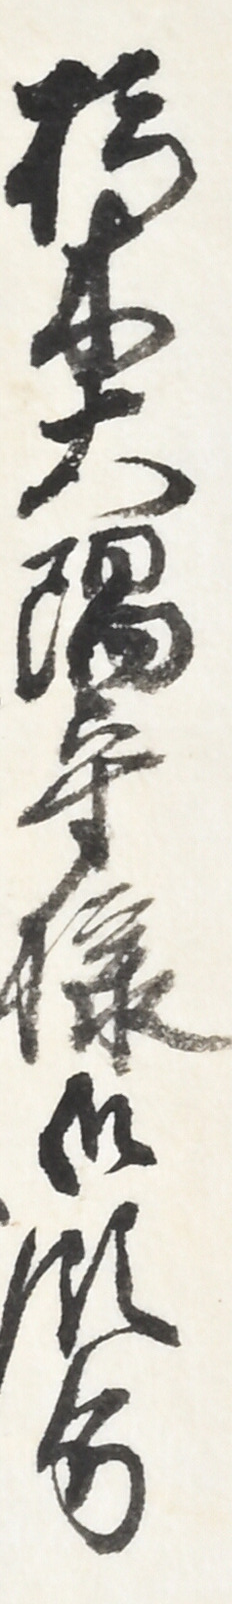朽木大隅守様御領分
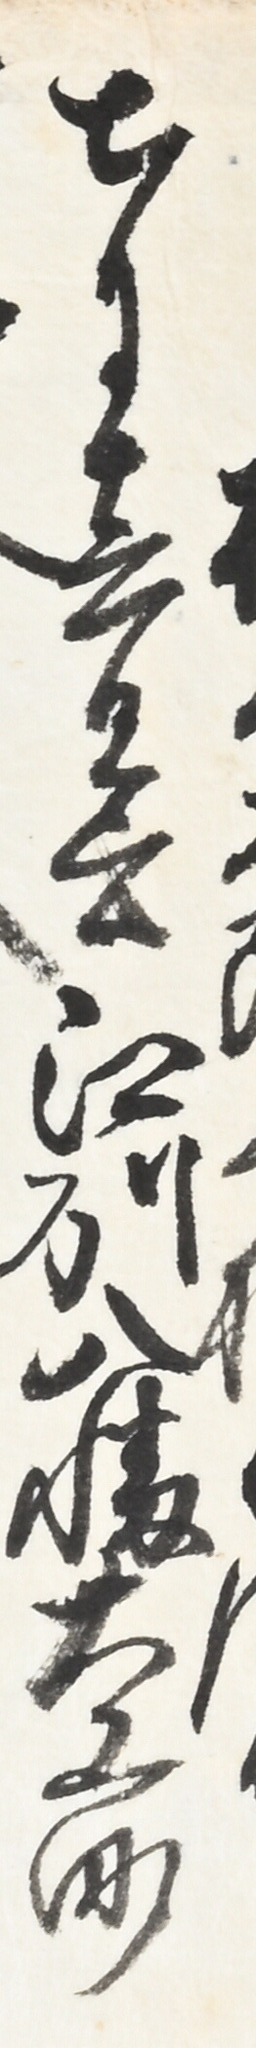七月十六日着江州八幡大工町
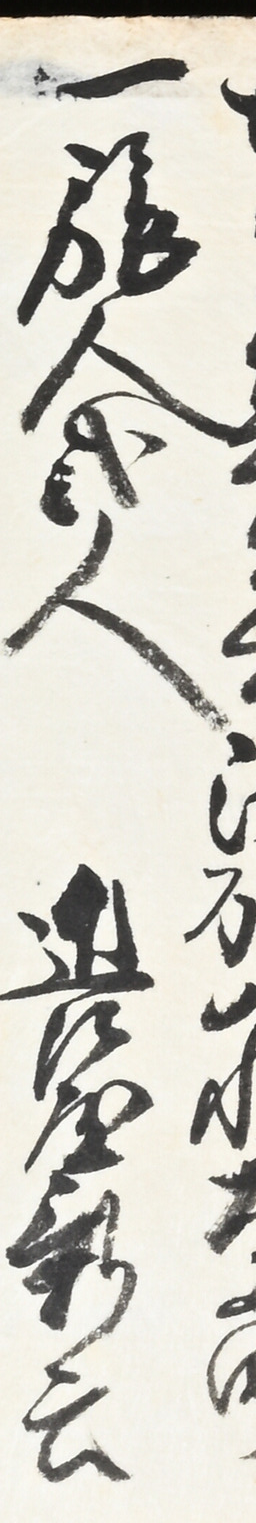一旅人弐人近江屋新六
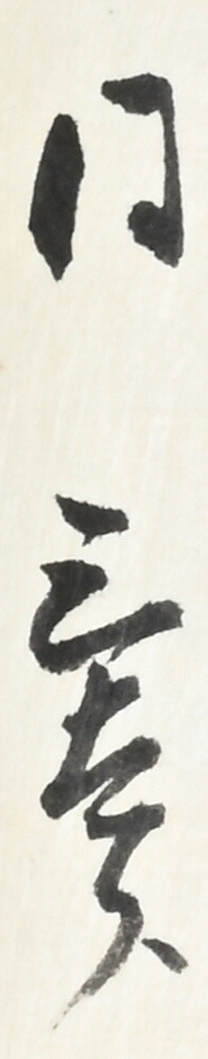同三太郎
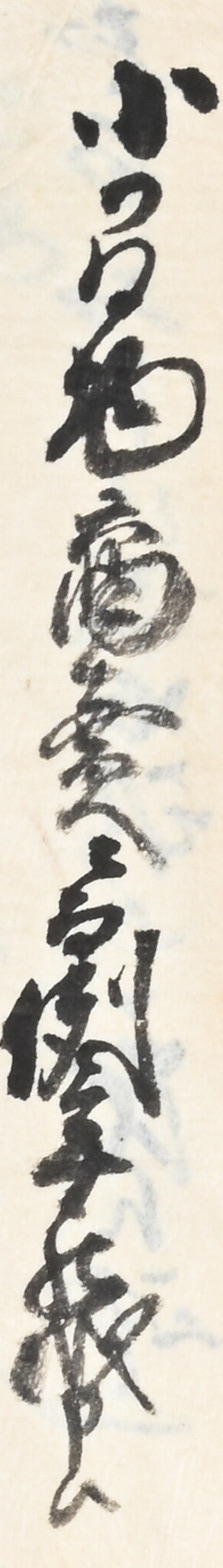小道具商売ニ而例年罷越申候
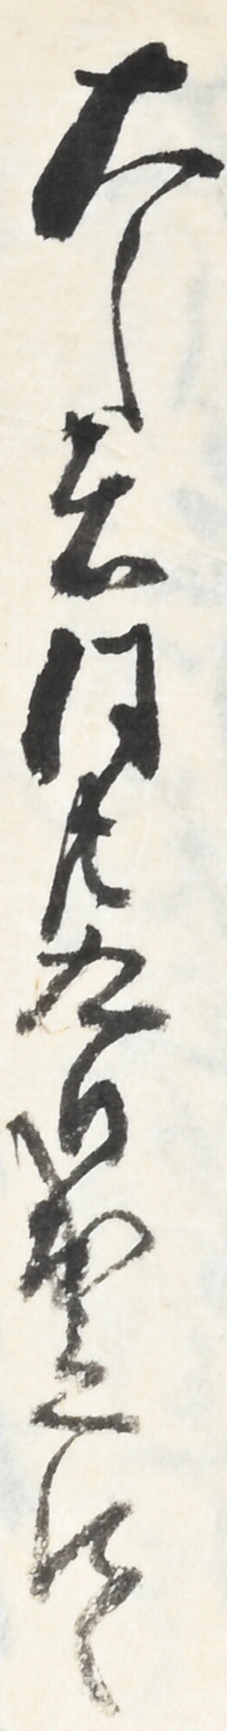右之者同廿三日出立仕候

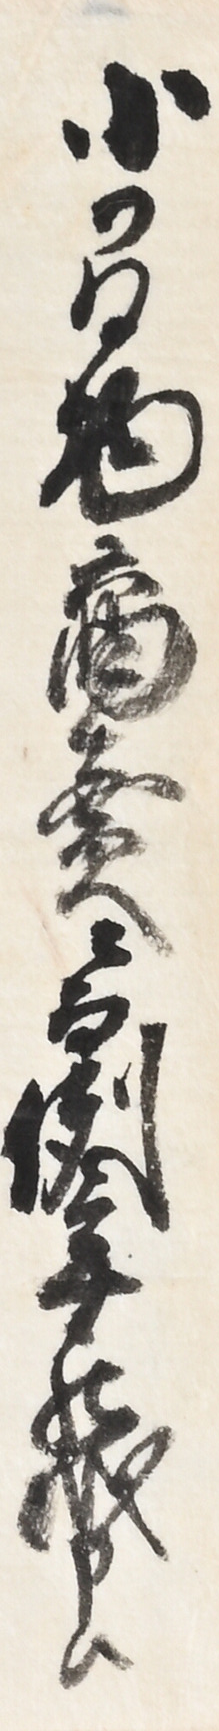小間物商売ニ而例年罷越申候
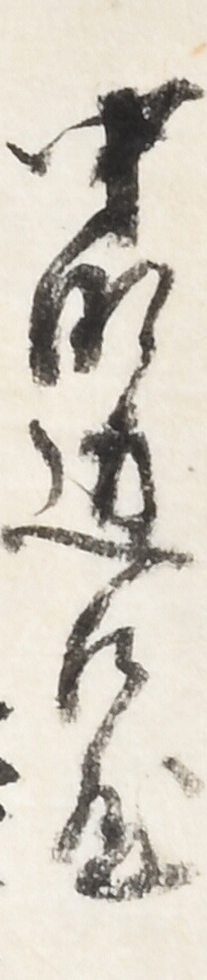中町近江屋
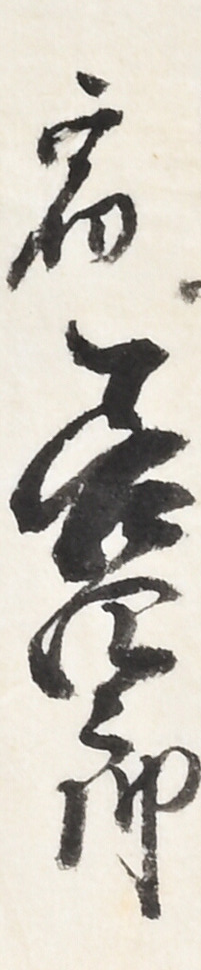宿善四郎
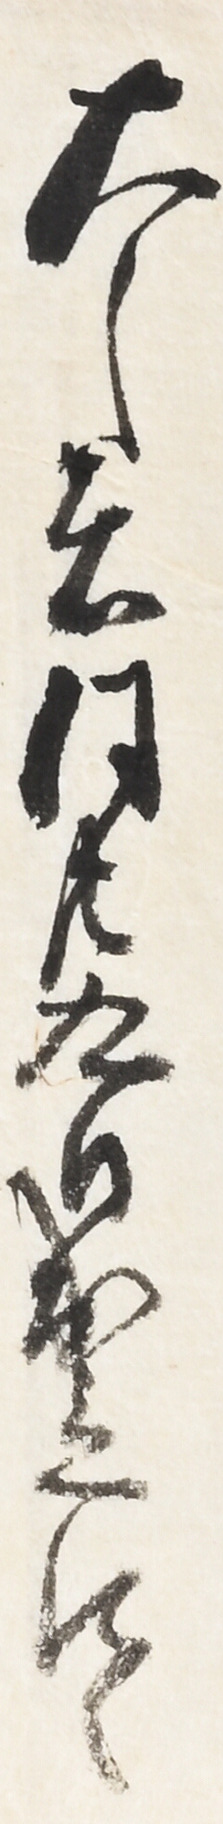右之者同廿九日出立仕候
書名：旅人泊控帳
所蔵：伊那市立高遠町図書館・合同会社AMANE
